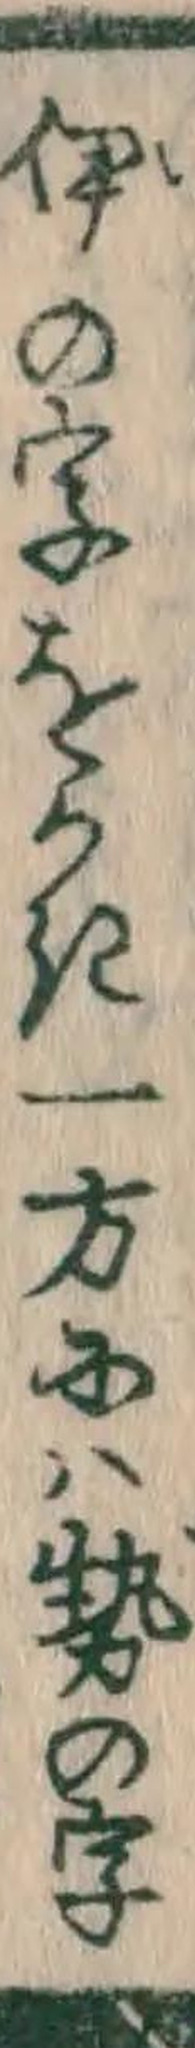伊の字をかき一方には勢の字
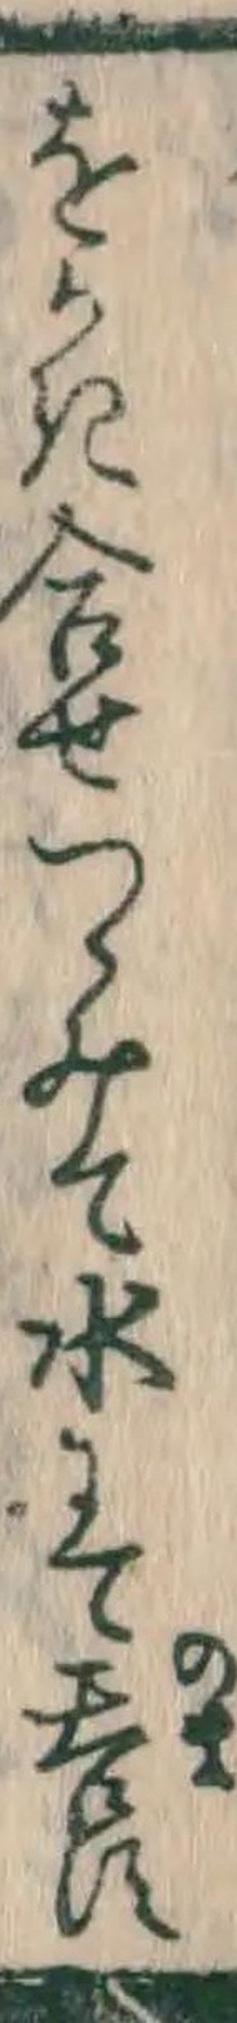をかき合せつゝみて水にて吞す
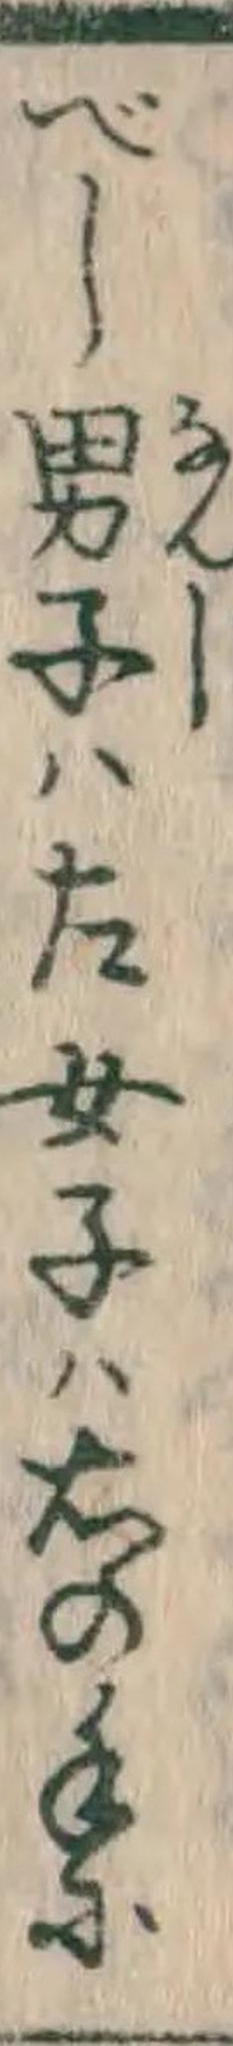べし男子は左女子は右の手に
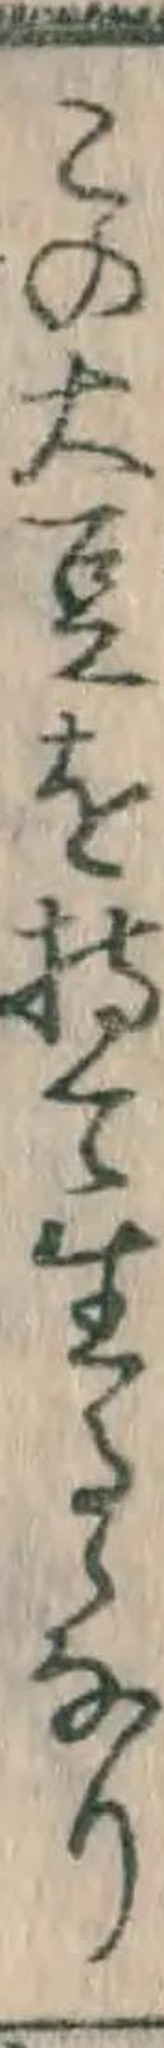この大豆を持て生るゝなり
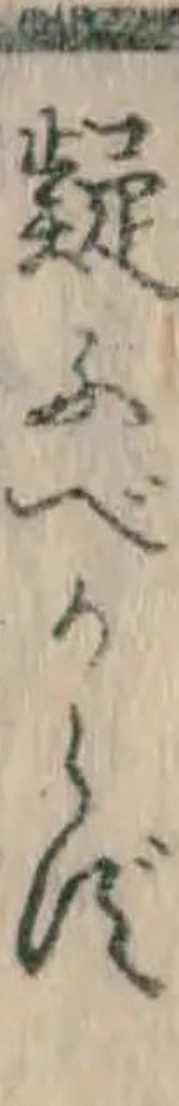疑ふべからず
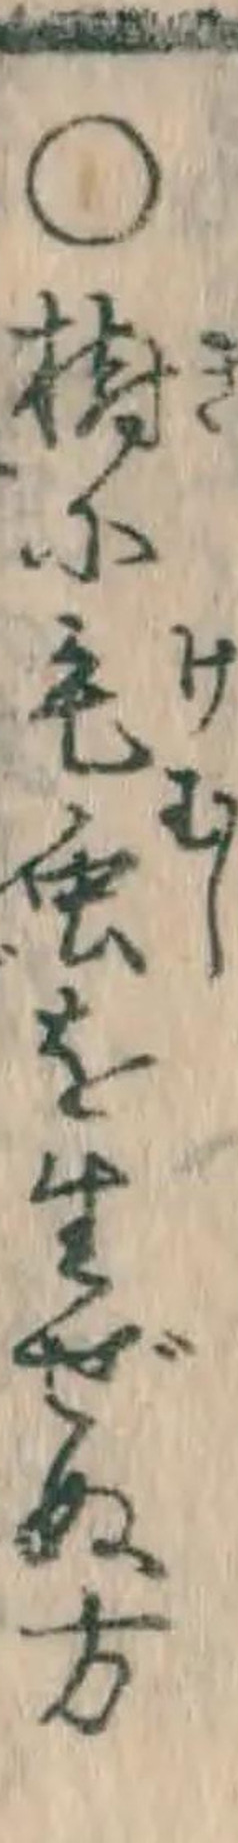○樹に毛虫を生ぜぬ方
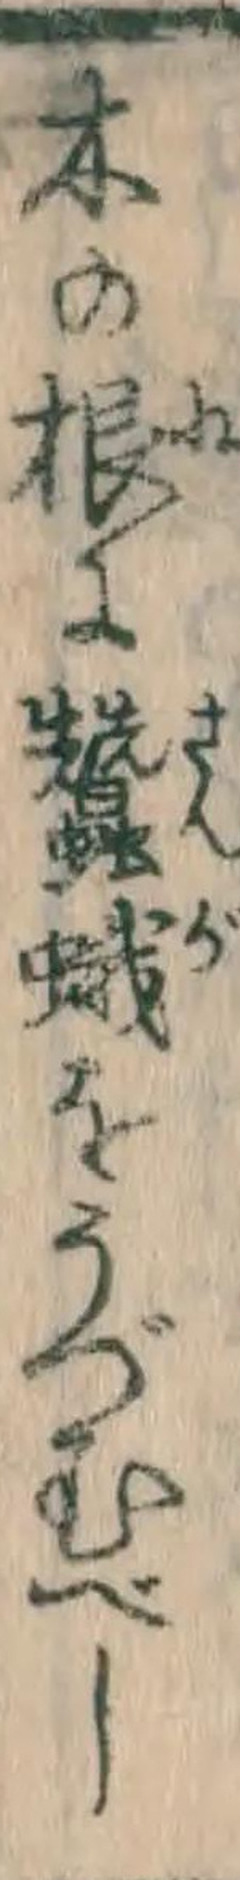木の根に蚕蛾をうづむべし

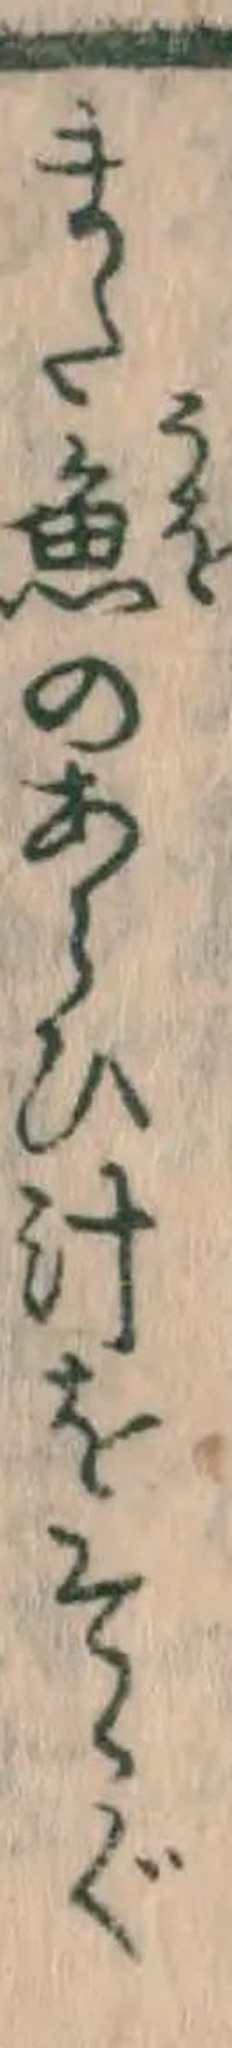また魚のあらひ汁をそゝぐ
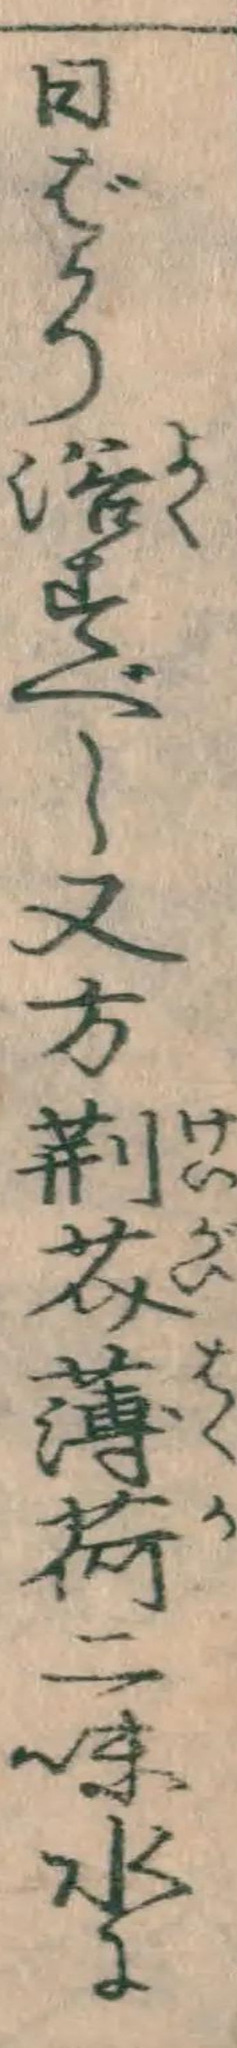日ばかり浴すべし又方荊芥薄荷二味水に
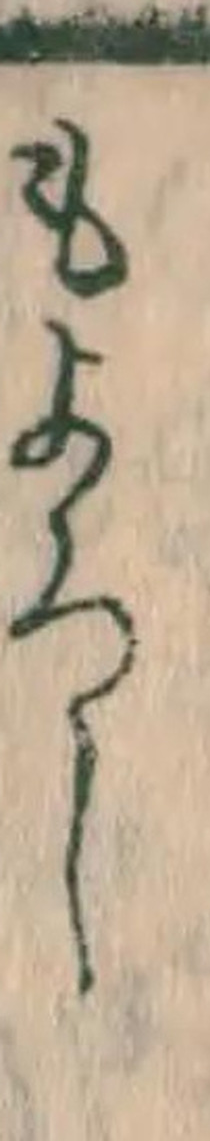もよろし
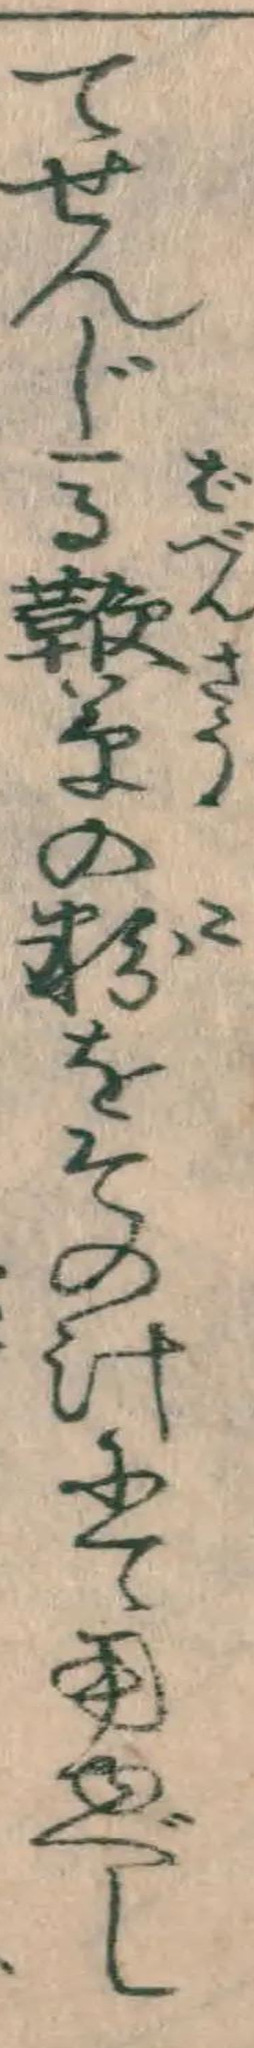てせんじ馬鞭草の粉をその汁にて用ゆべし
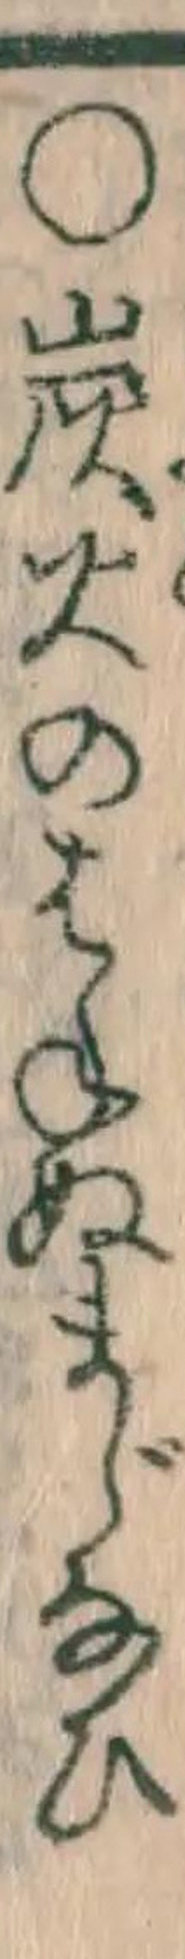○炭火のはねぬまじなひ
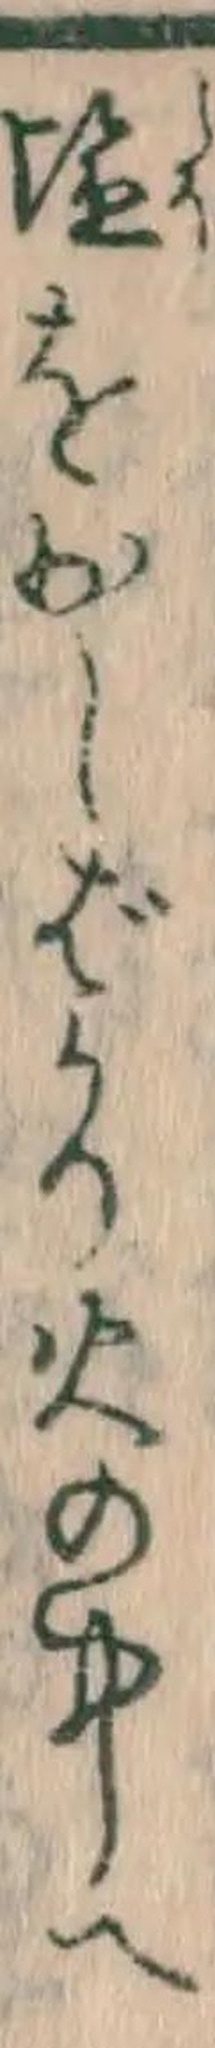塩を少しばかり火の中へ
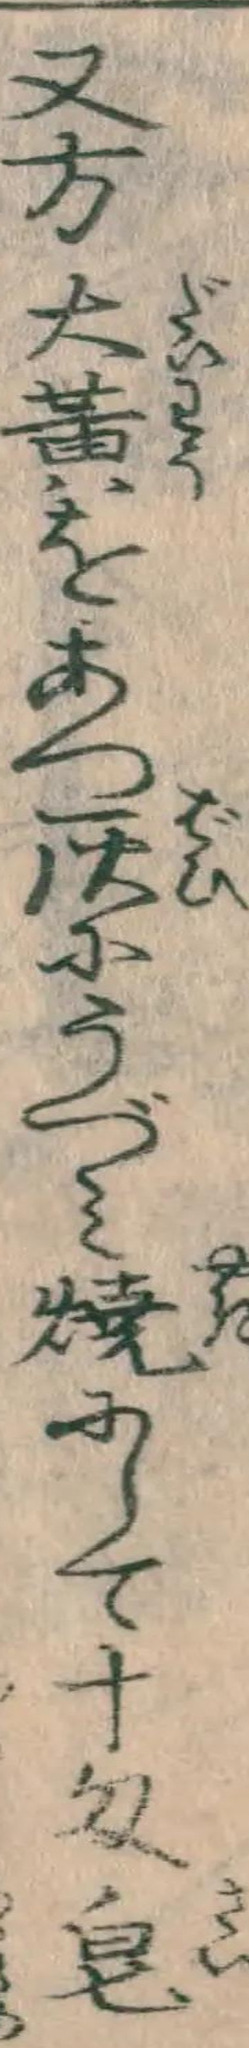又方大黄をあつ灰にうづみ焼にして十匁皀
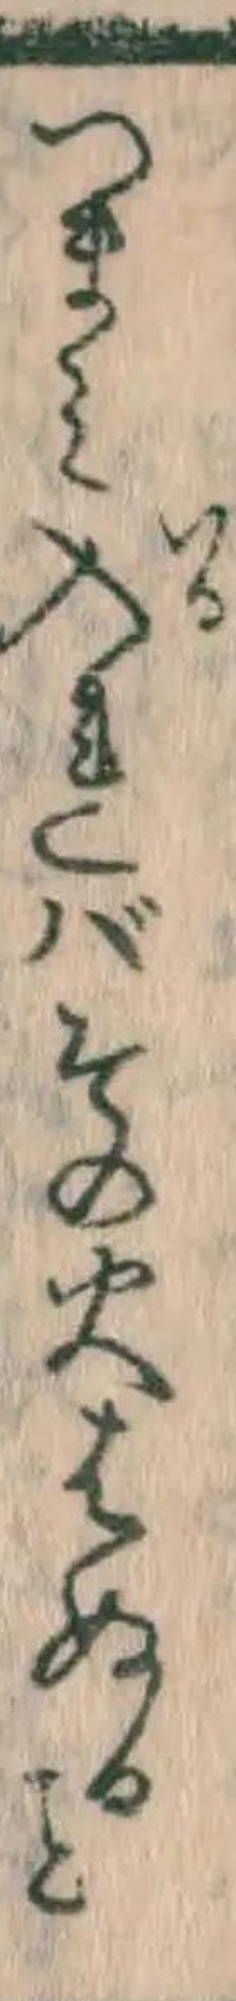つまみ入ればその火はぬること
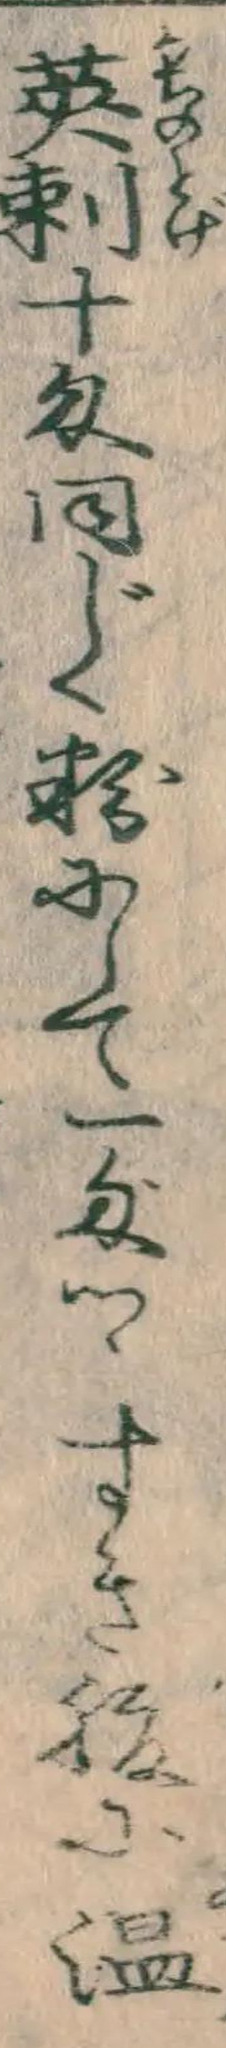莢刺十匁同じく粉にして一匁ツヽすき腹に温
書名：広益秘事大全 3巻. [4]
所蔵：国立国会図書館 National Diet Library, JAPAN
